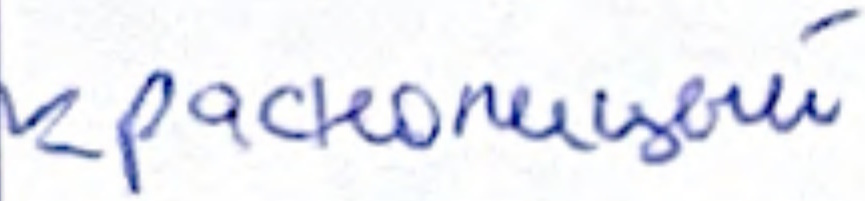краснолицый
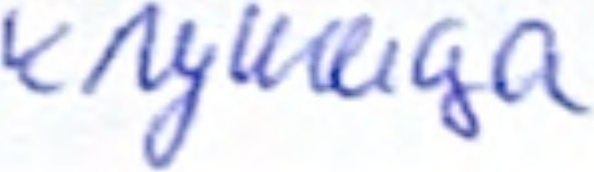клушица
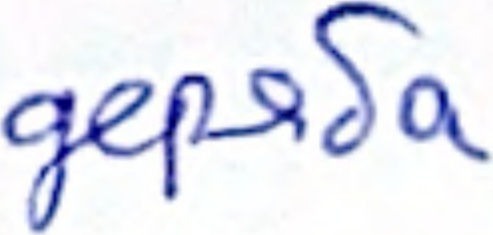деряба
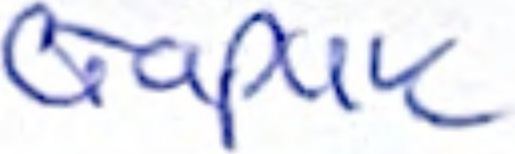старик
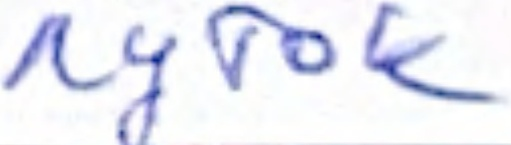луток
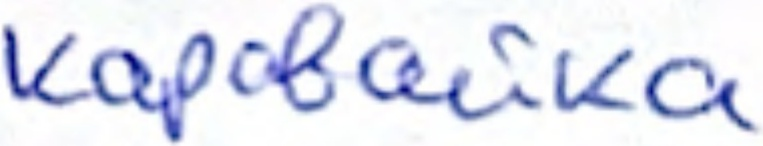каравайка
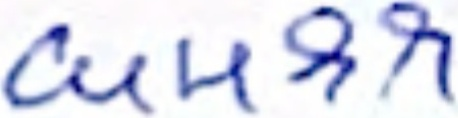синяя
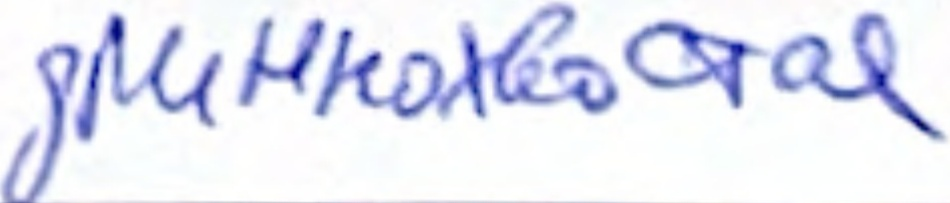длиннохвостая
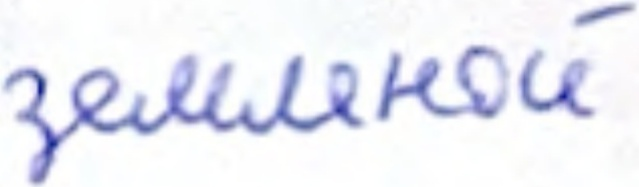земляной
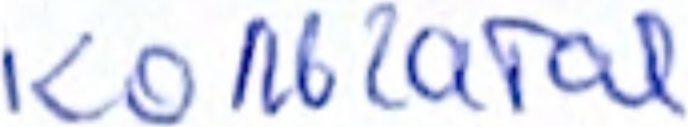кольчатая
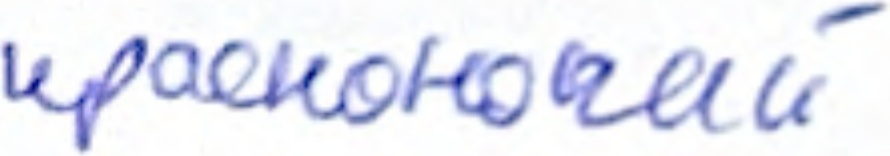красноногий
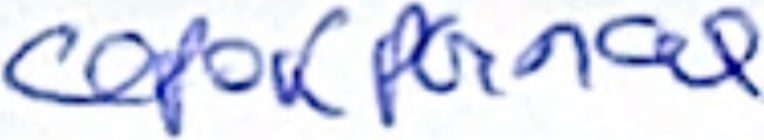серокрылая
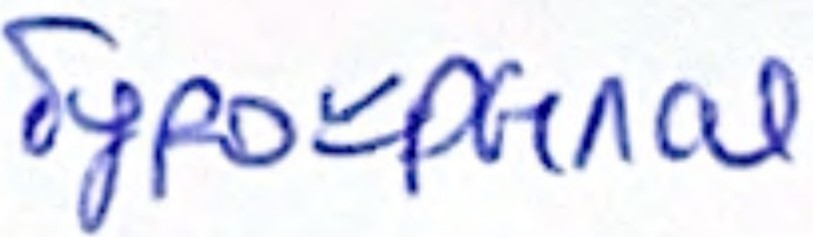бурокрылая
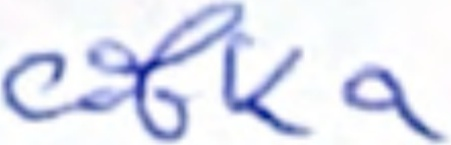совка
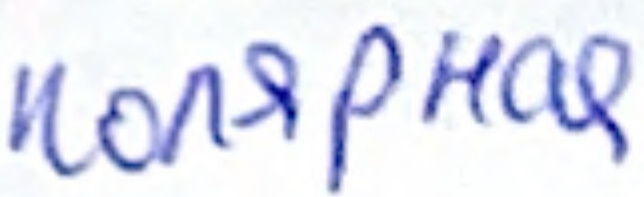полярная
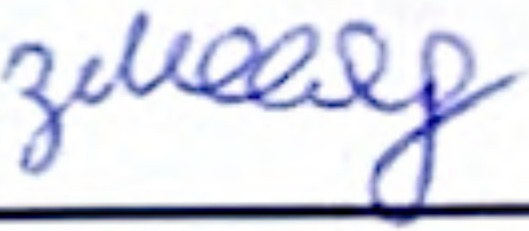змееяд
